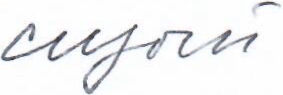сизый
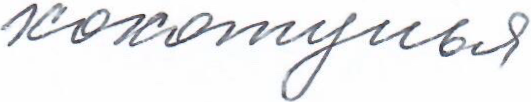хохотунья
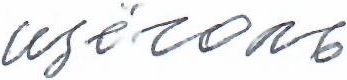щёголь
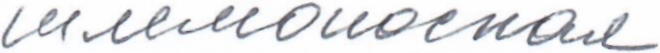шлемоносная
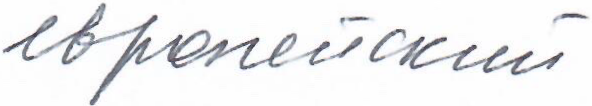европейский
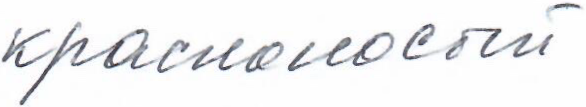красноносый
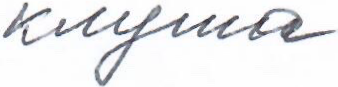клуша
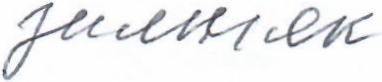зимняк
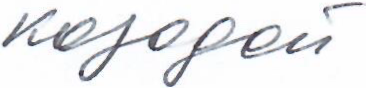козодой
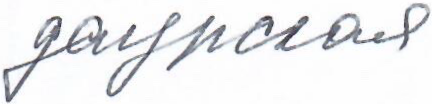даурская
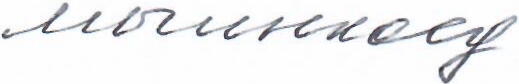личинкоед
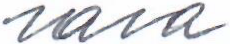гага
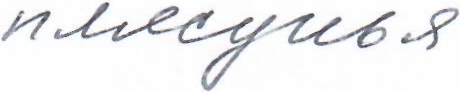плясунья
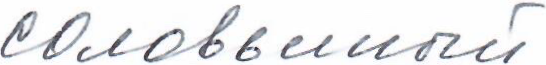соловьиный
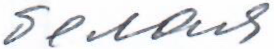белая
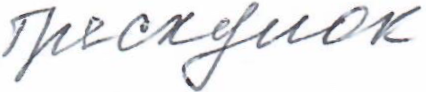трескунок
